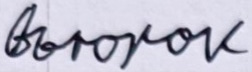вьюрок
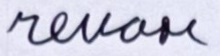чекан
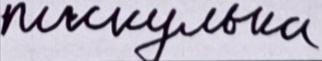пискулька
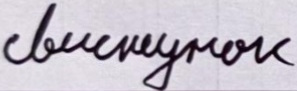свистунок
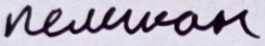пеликан
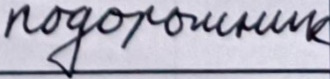подорожник
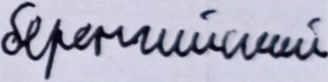беренгийский
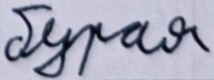бурая
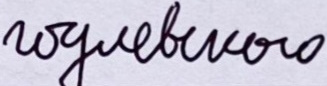годлевского
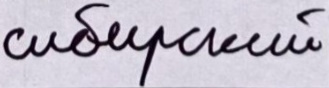сибирский
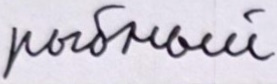рыбный
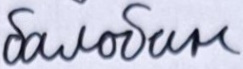балобин
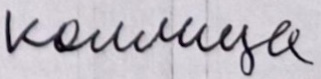коллица
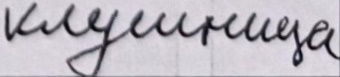клушница
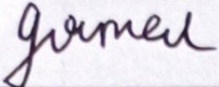дятел
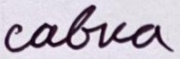савка
